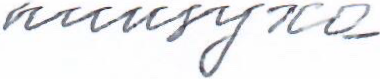пищуха
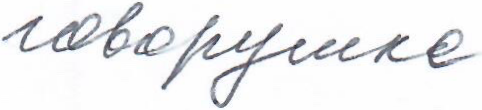говорушка
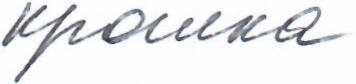крошка
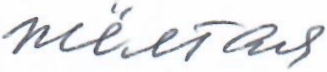жёлтая
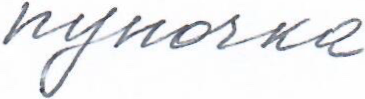пуночка
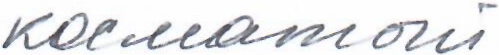косматый
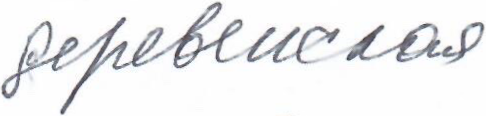деревенская
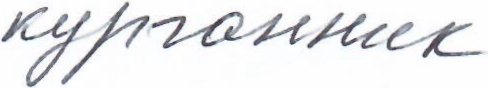курганник
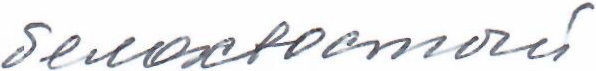белохвостый
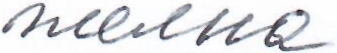желна
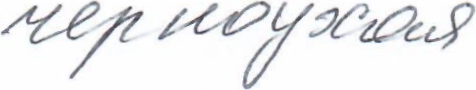черноухая
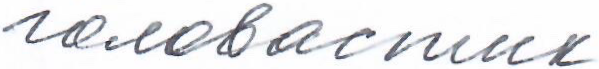головастик
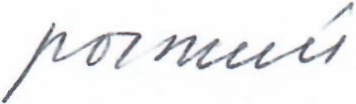рыжий
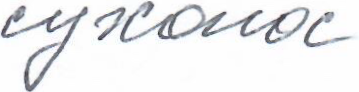сухонос
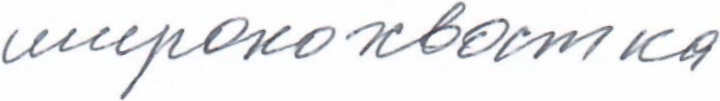широкохвостка
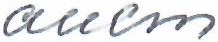аист
